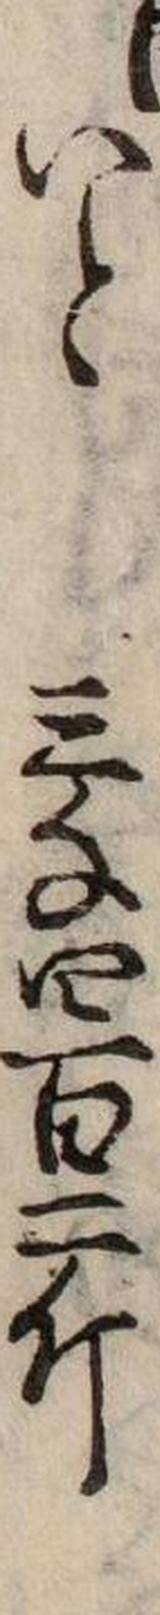いと三千四百二斤
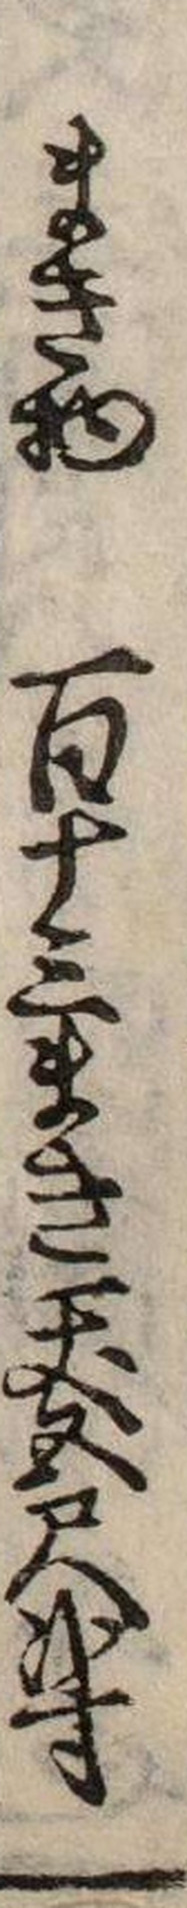まき物百十三まき一丈五尺弐寸
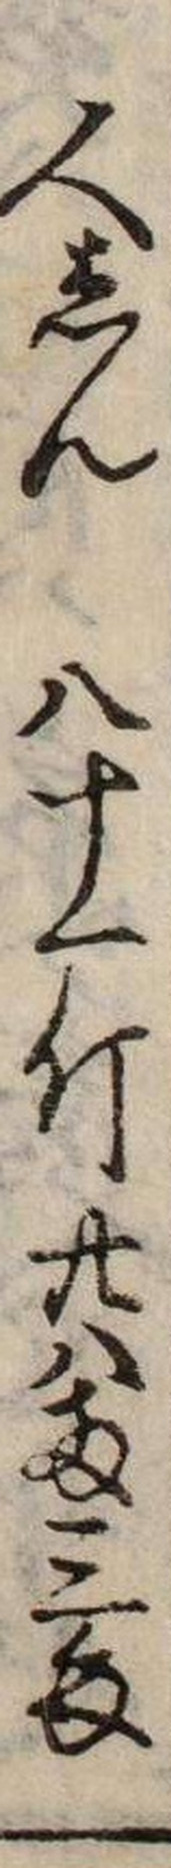人しん八十一斤廿八両三匁
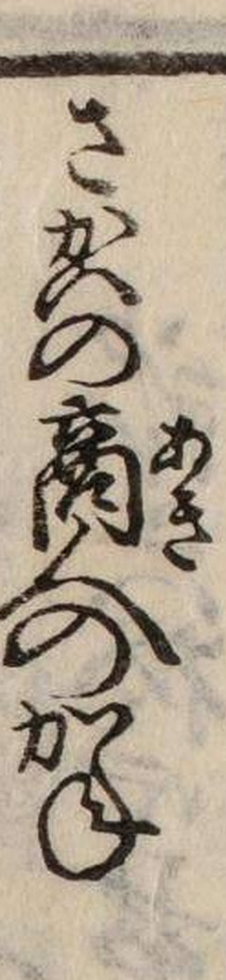さかいの商人のかね
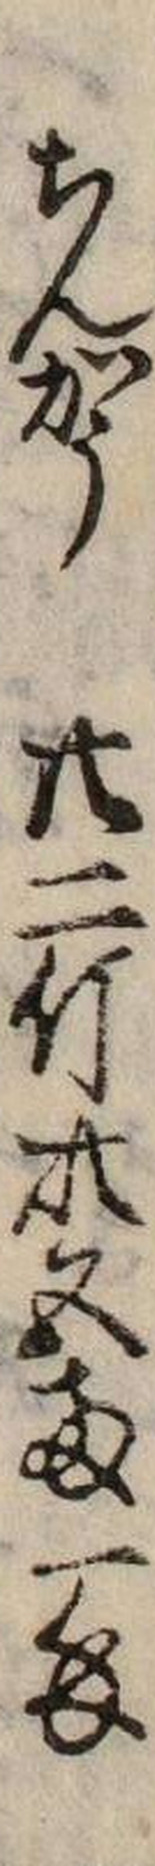ちんかう廿二斤卅五両一匁
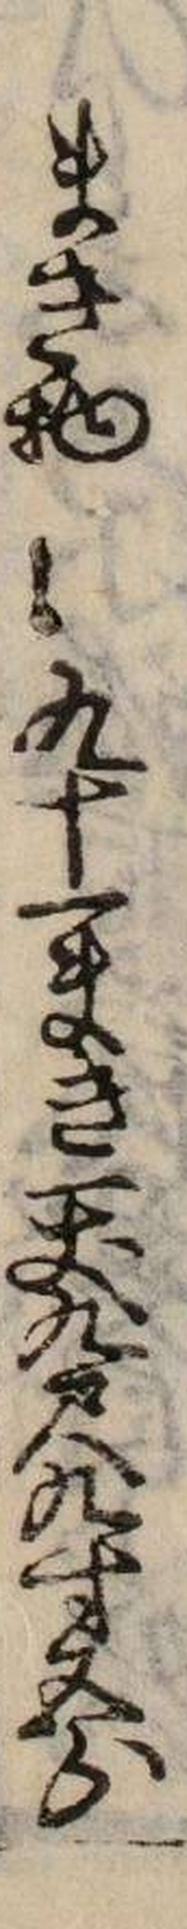まき物九十一まき一丈九尺九寸五分
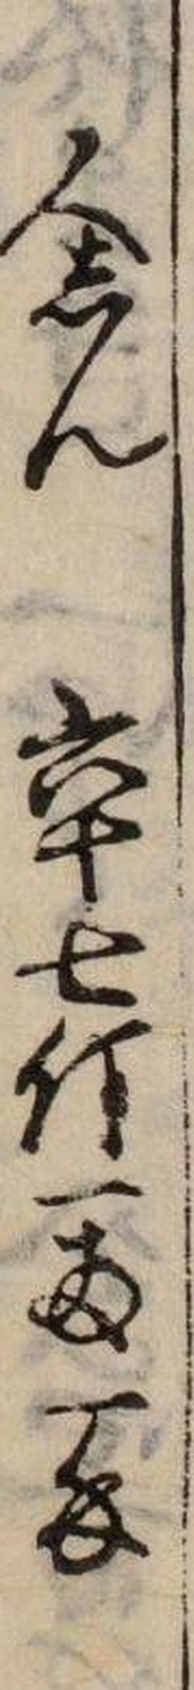人しん六十七斤一両一匁
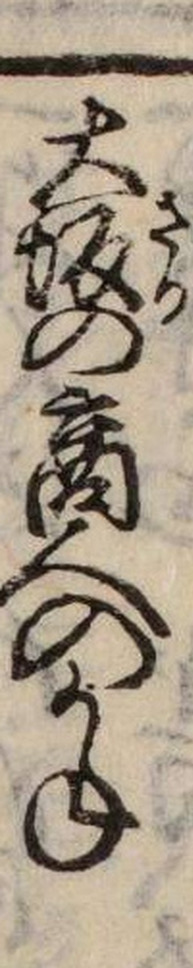大坂の商人のかね
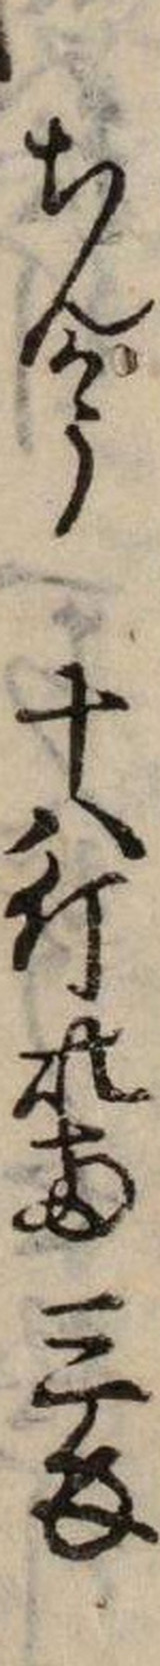ちんがう十八斤卅両三匁
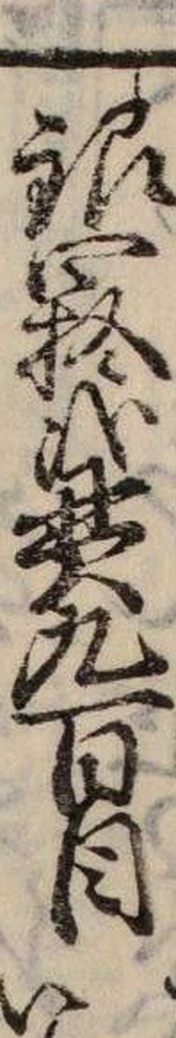銀四拾弐貫九百目
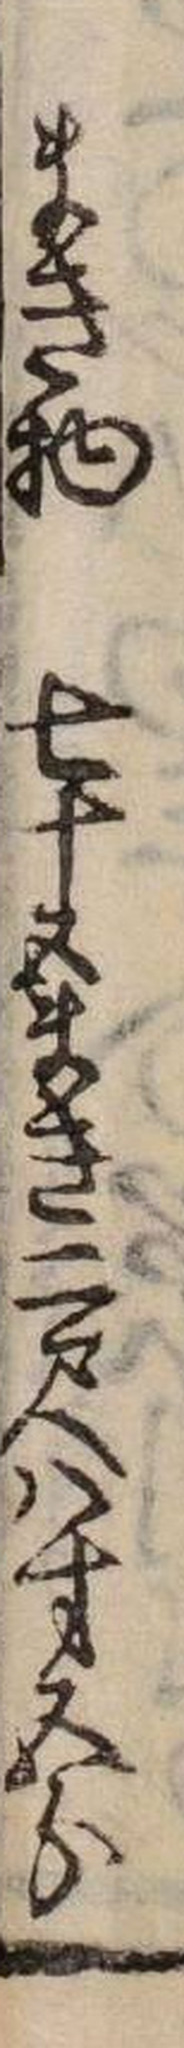まき物七十五まき三尺八寸五分
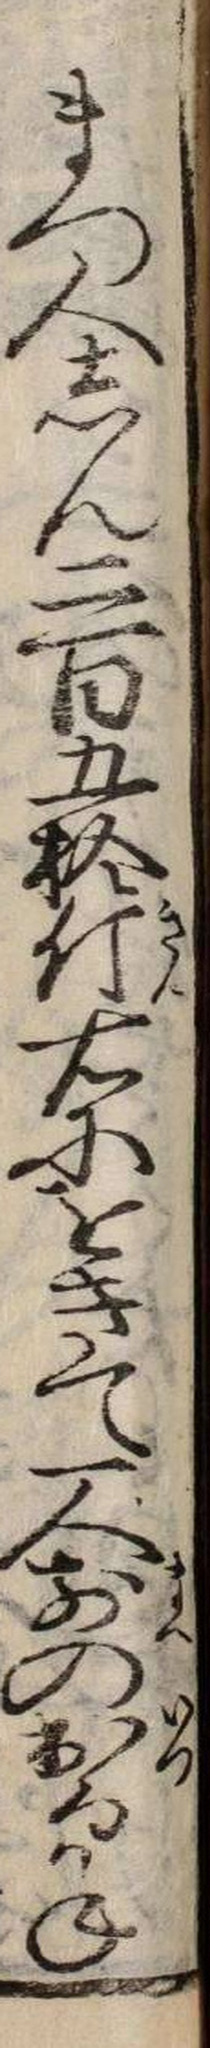まつ人しん二百五拾斤右にをきて一人前の出るかね
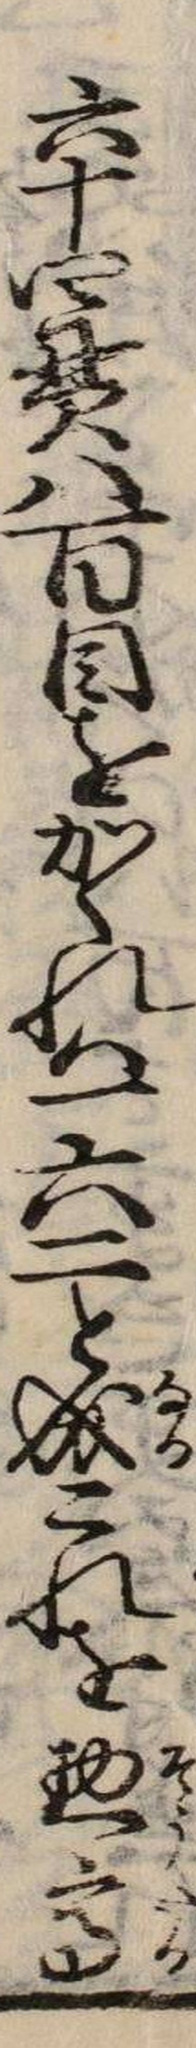六十四貫八百目をかくれは一六二と成これを惣高
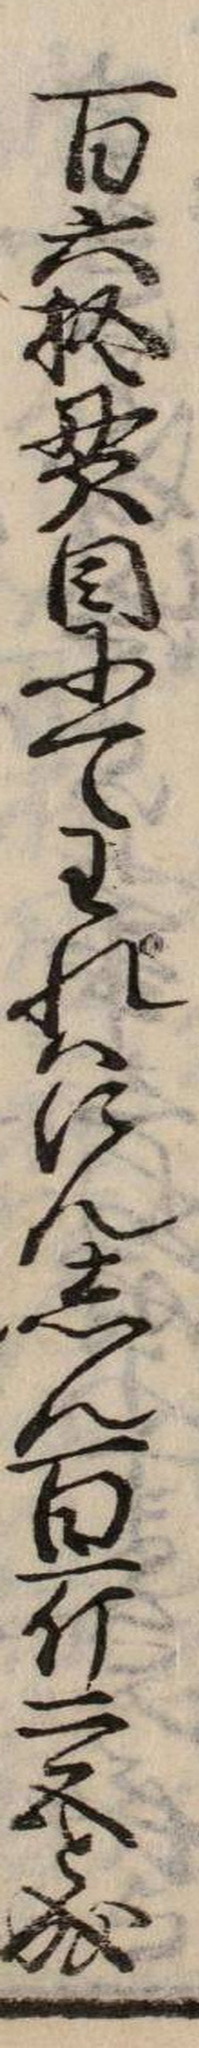百六拾貫目にてわれはにんしん百一斤二五と成
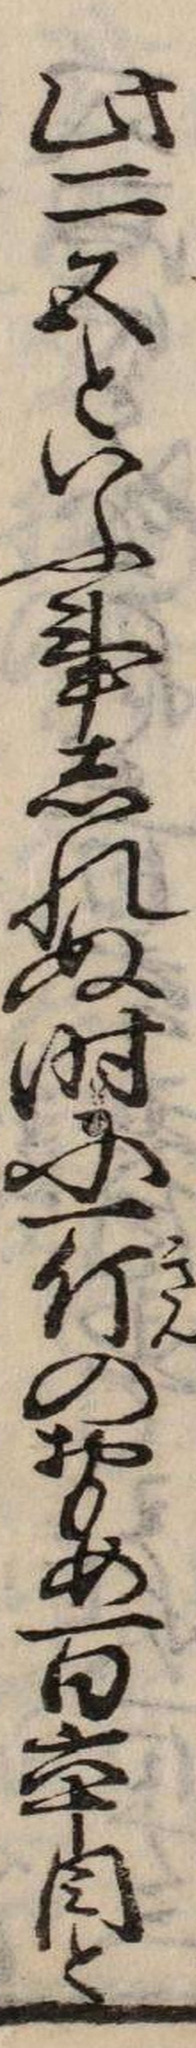此二五といふ事しれぬ時に一斤のおもめ百六十目と
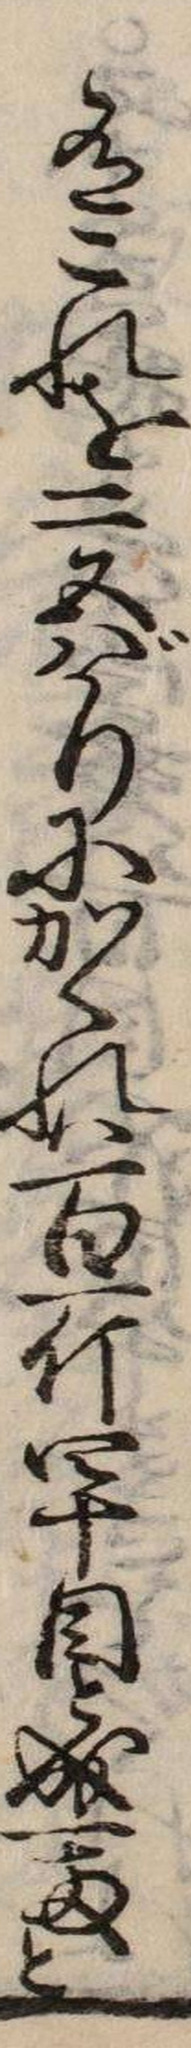有これを二五ばかりにかくれは百一斤四十目と成一両と
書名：塵劫記（寛永11年自跋、京都府立京都学・歴彩館追貴8）
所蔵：京都府立京都学・歴彩館 国文学研究資料館
